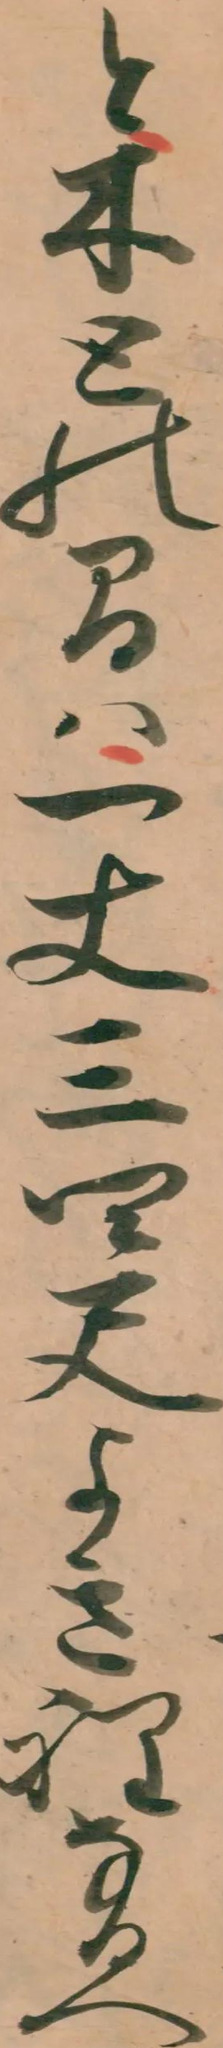と木との間ハ一丈三四尺よき程なるへ
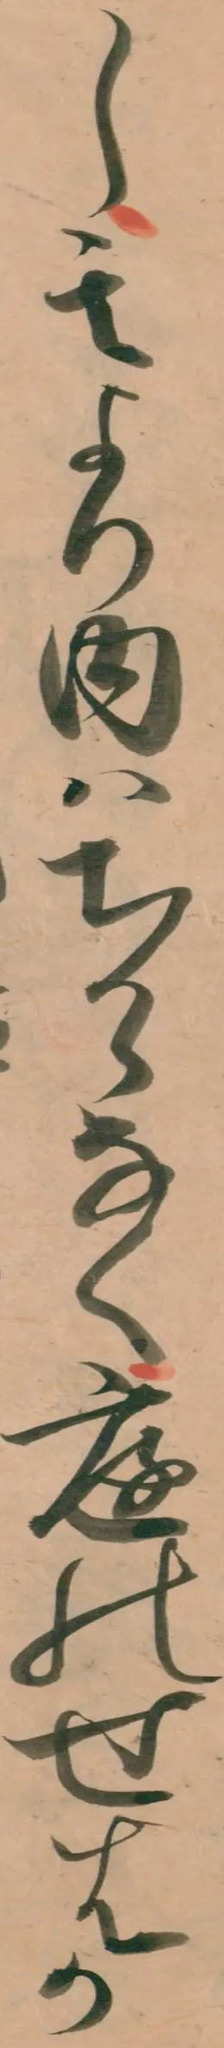し其より内ハちからなく庭のせはか
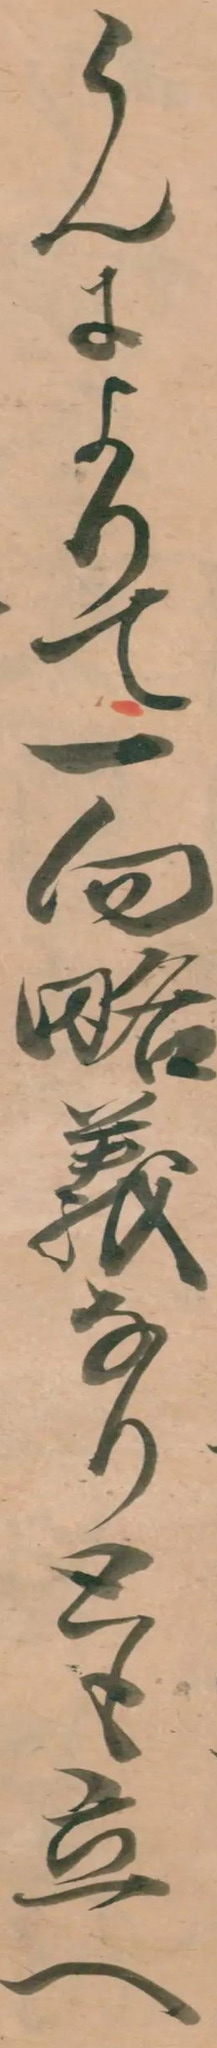らんによりて一向略義なりとも立へ
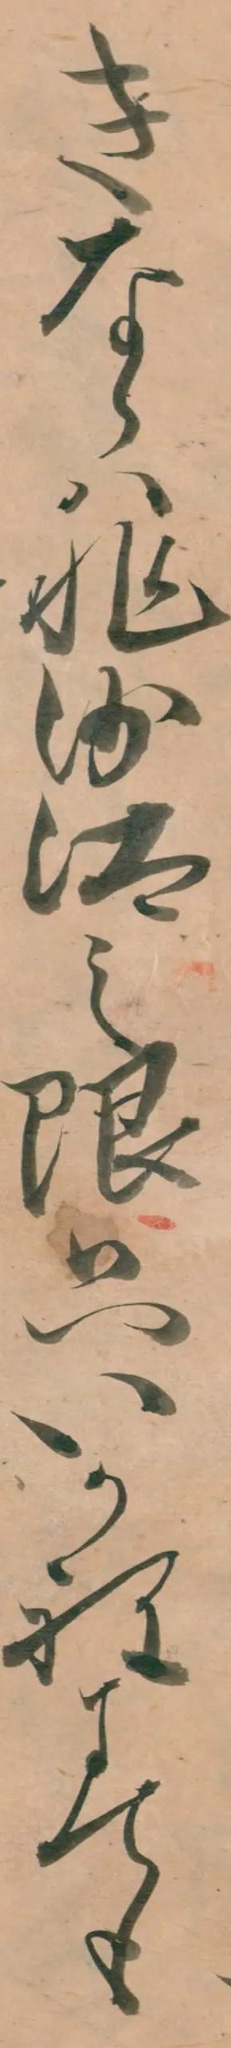きならハ非沙汰之限只いか程にても
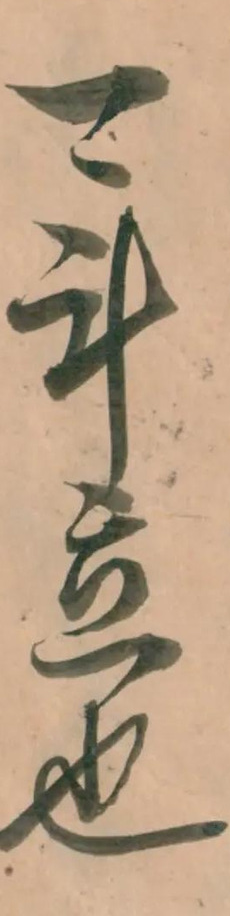可計立也
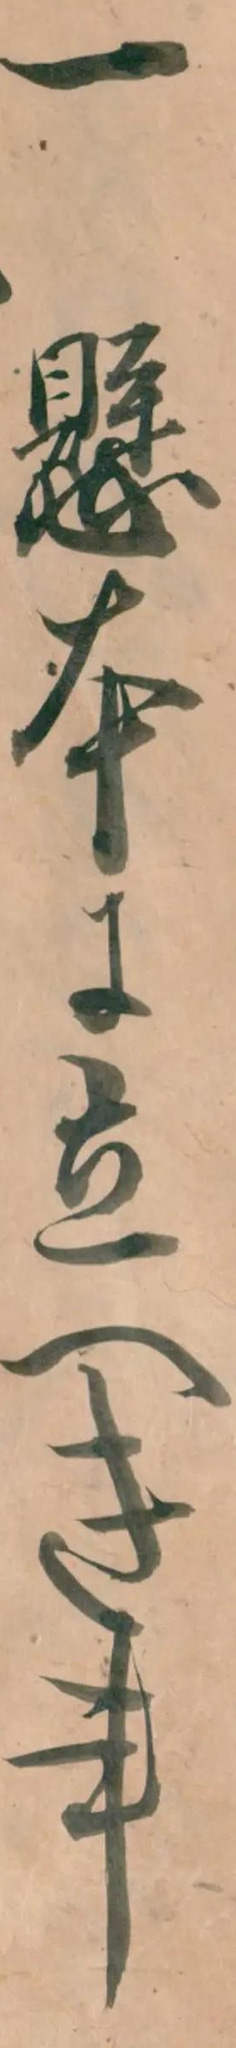一懸本に立へき事
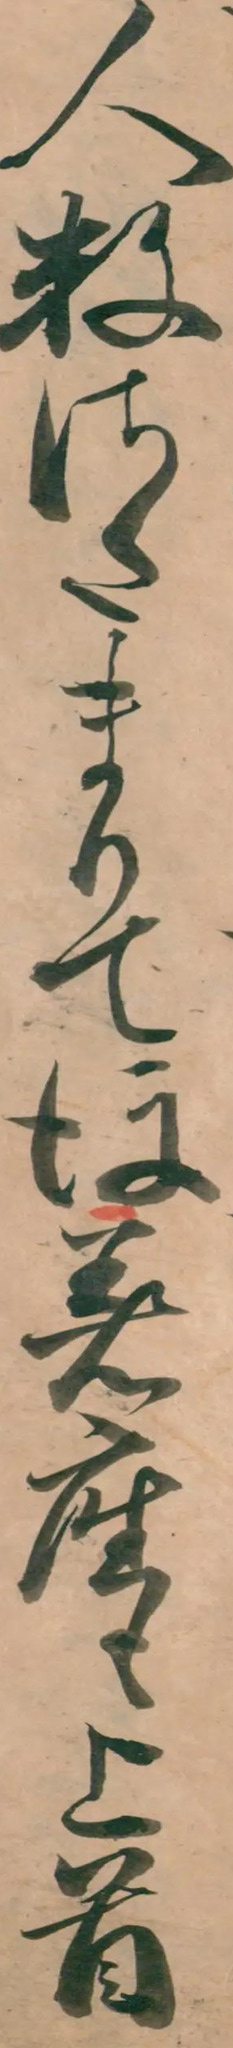人数さたまりて後着座も上首
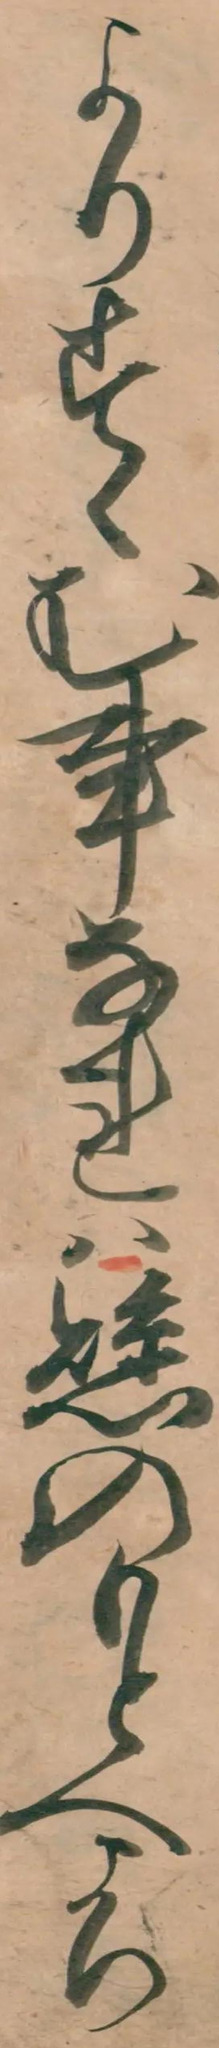よりすゝむ事なれハ懸のもとへより

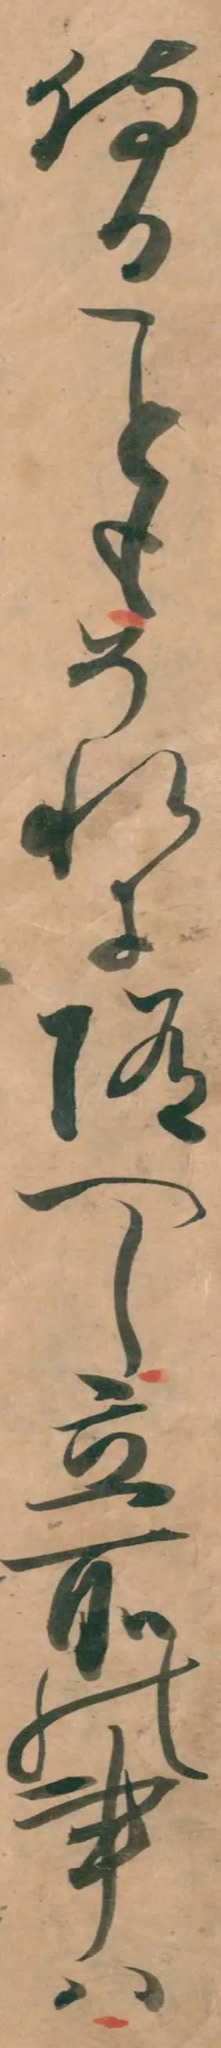侍ることもそれに極へし立所の事ハ
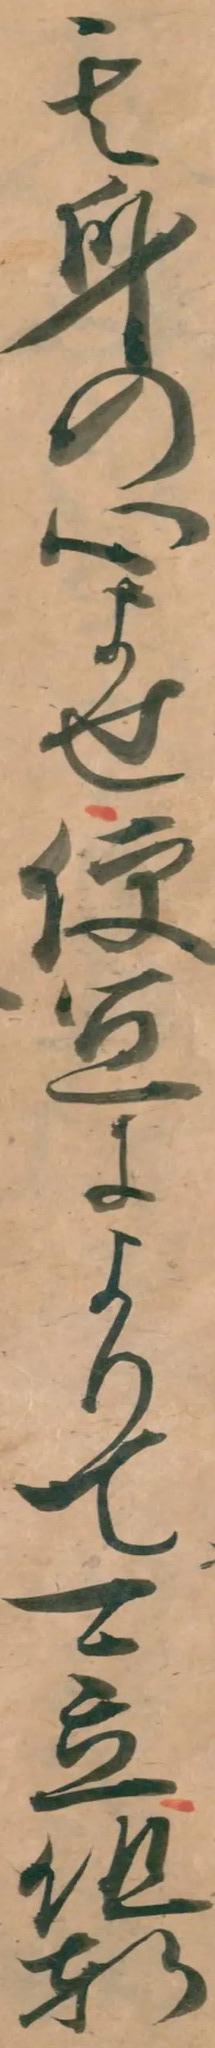其身の心よせ便宜によりて可立但軒
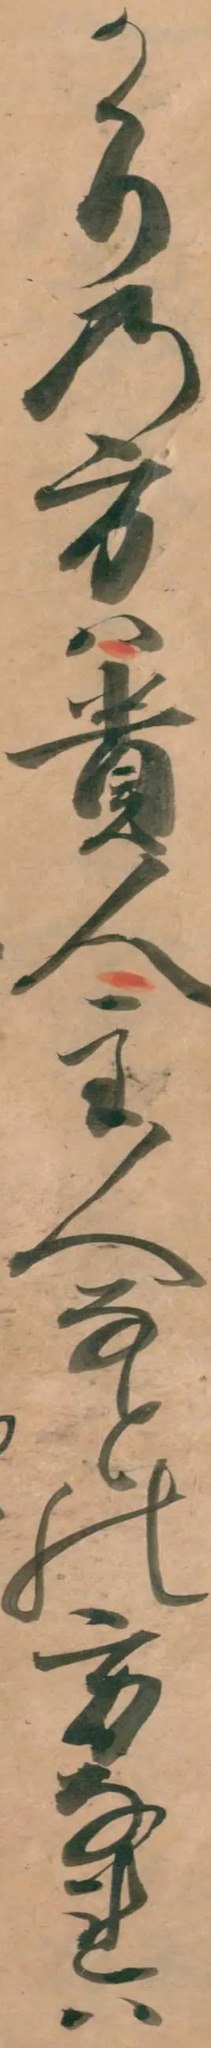かゝりの方ハ貴人主人なとの方なれハ
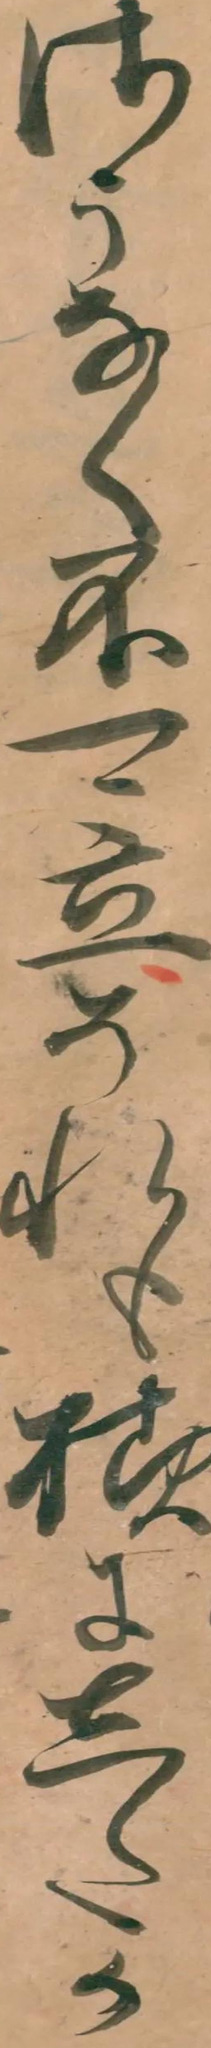さうなく不可立それも様にしたか
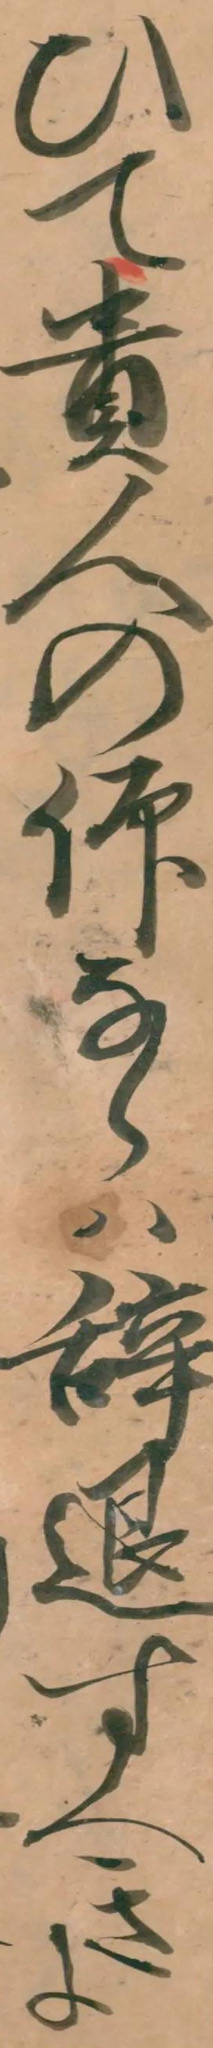ひて貴人の仰ならハ辞退すへきに
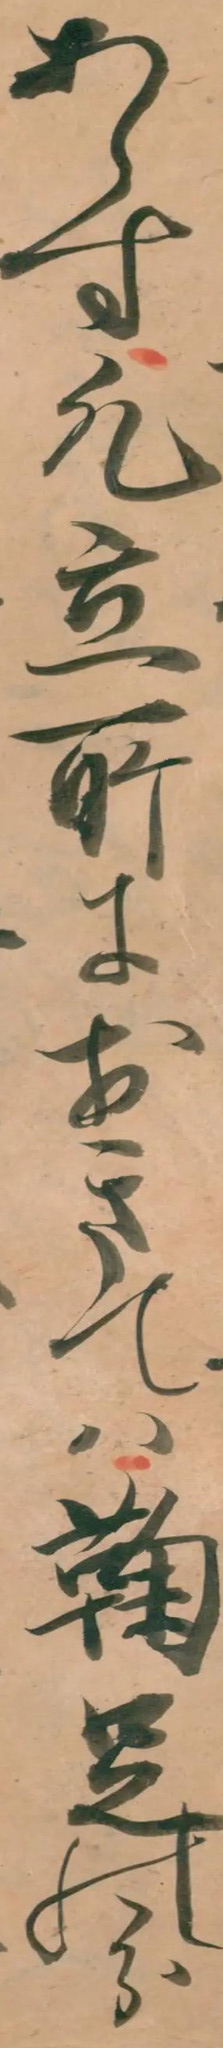あらす凡立所におきてハ鞠足の分
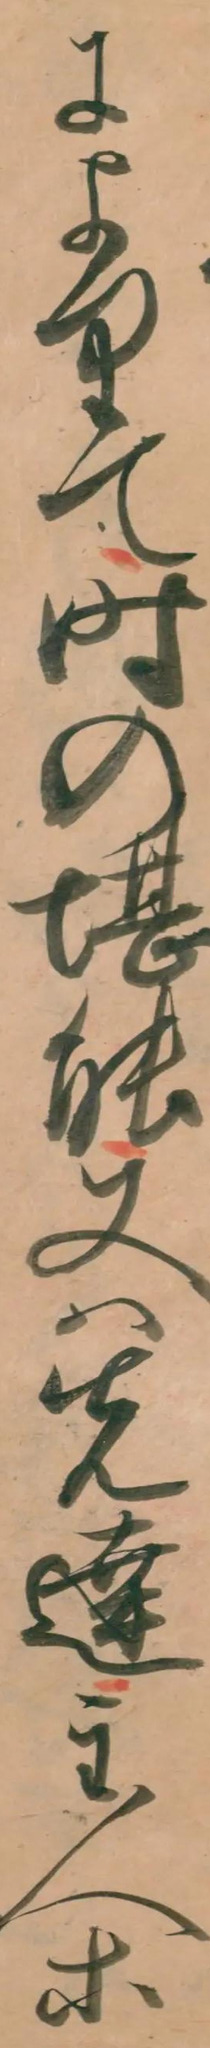によりて時の堪能又ハ先達主人等
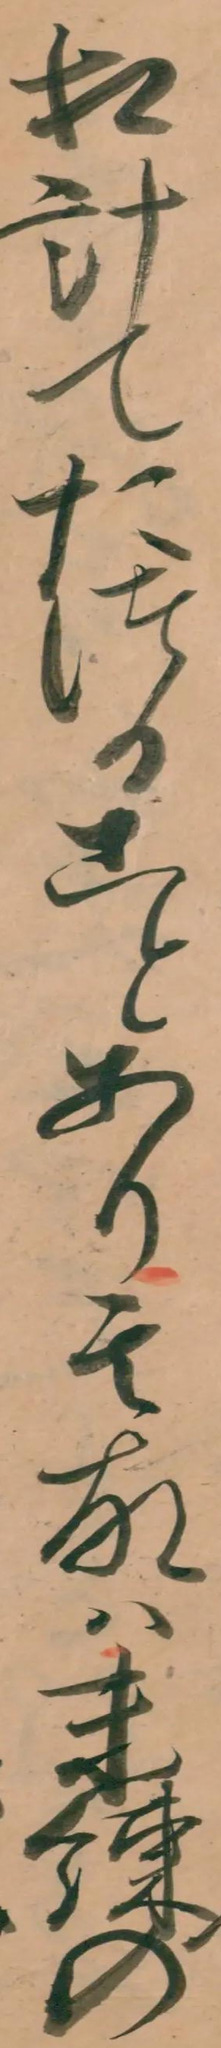相計てたつることあり其故ハ未練の
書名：蹴鞠之条々大概
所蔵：国立国会図書館 National Diet Library, JAPAN
